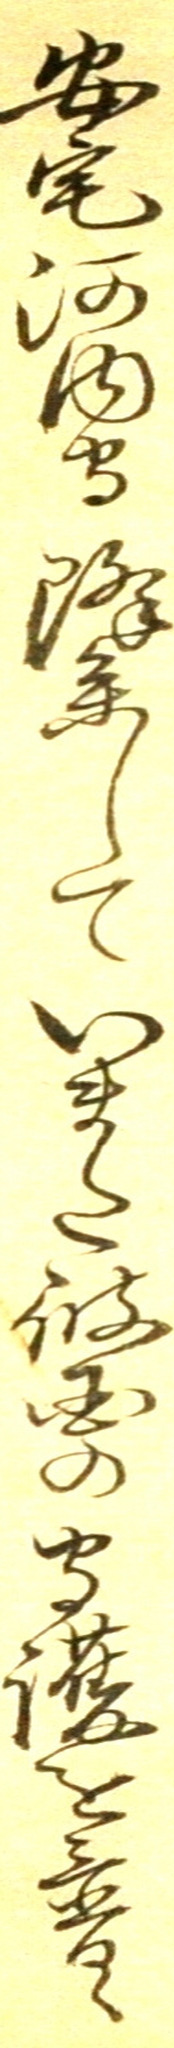安宅河内守降参していまた彼国の守護を置るゝ
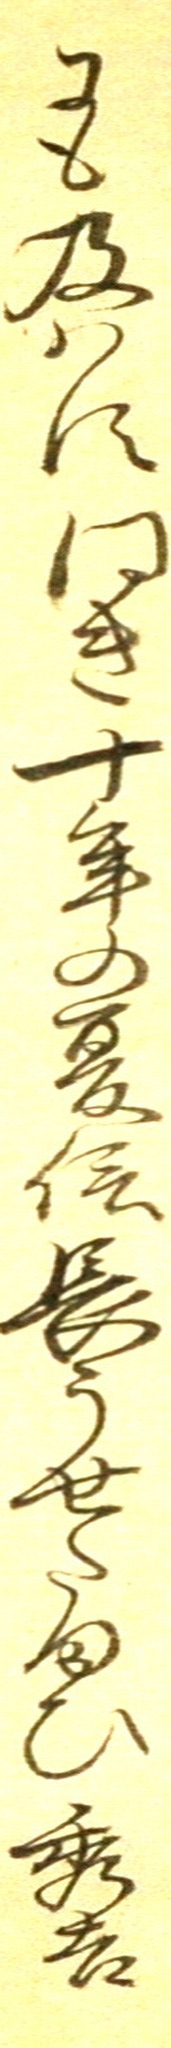にも及はす同き十年の夏信長うせたまひ秀吉
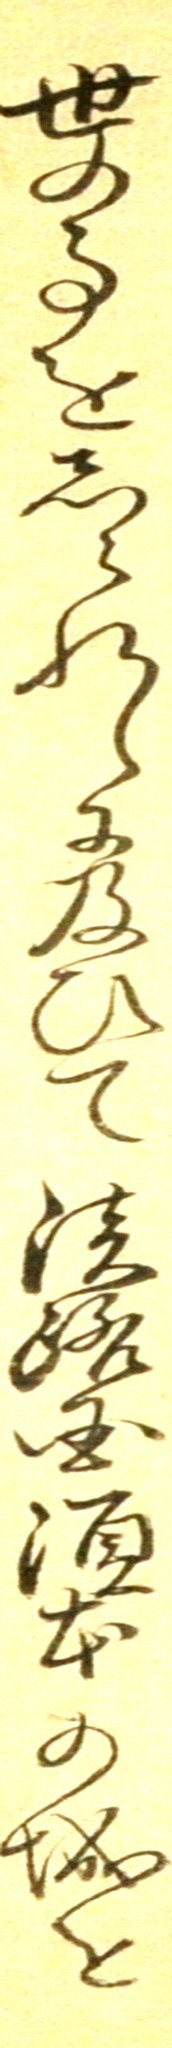世の事をしられしに及ひて淡路国須本の城を
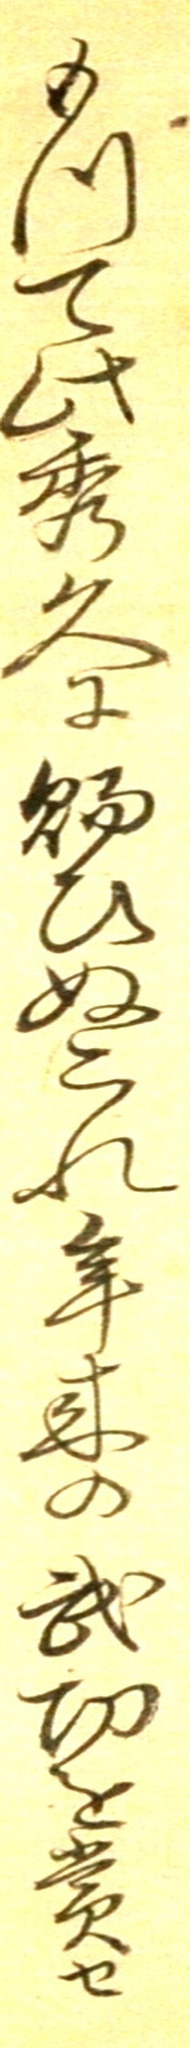もつて此秀久に賜ひぬこれ年来の武功を賞せ
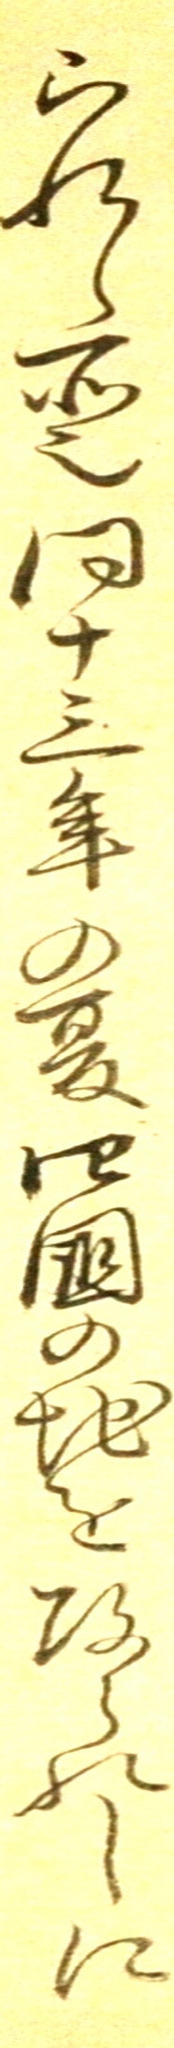られし所也同十三年の夏四国の地を攻られしに
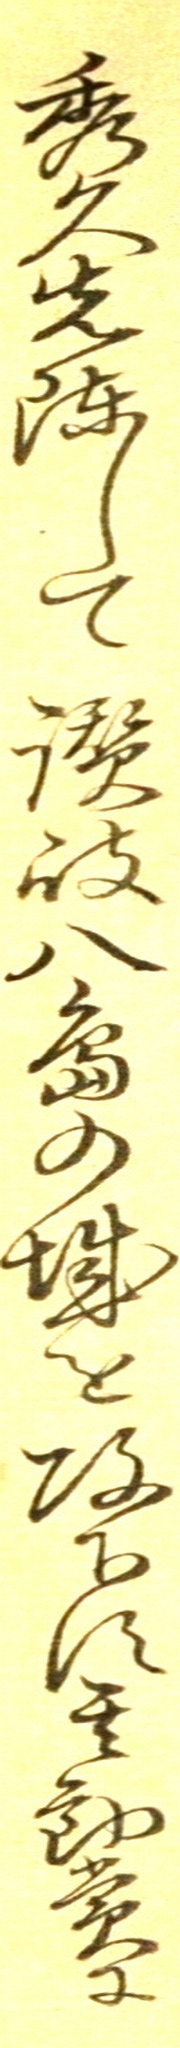秀久先陣して讃岐八島の城を攻下す其勧賞に

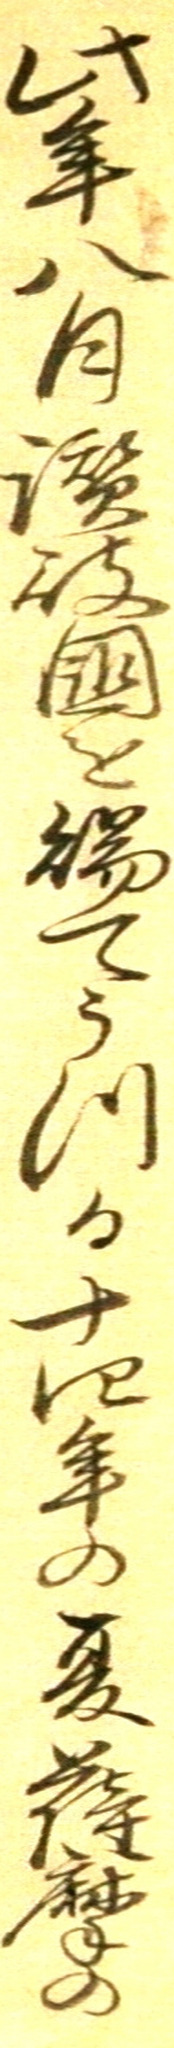此年八月讃岐国を賜てうつる十四年の夏薩摩の
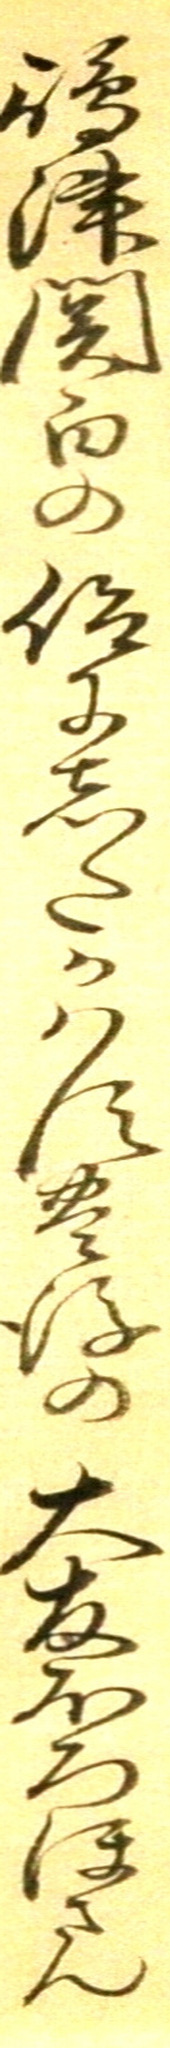島津関白の仰にしたかはす豊後の大友ほろほさん
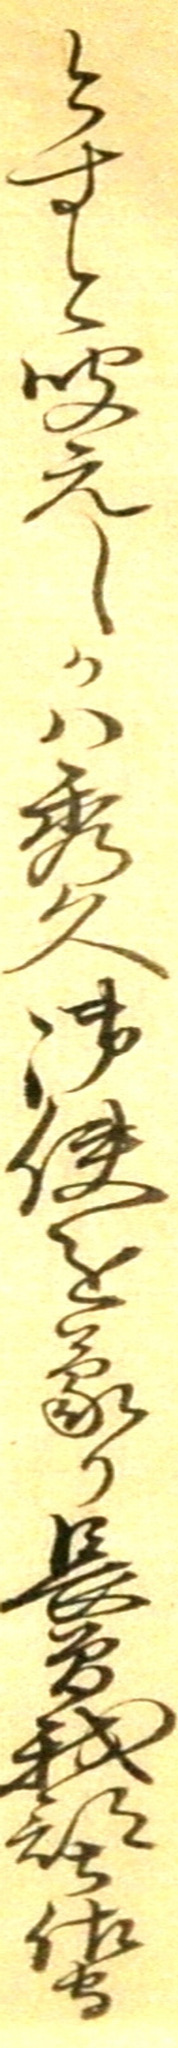とすと聞えしかは秀久御使を蒙り長曾我部土佐守
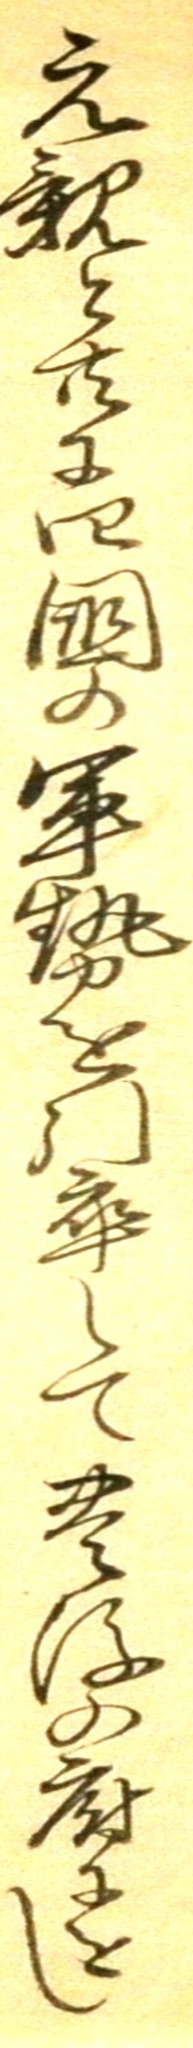元親と共に四国の軍勢を引率して豊後の府にをし
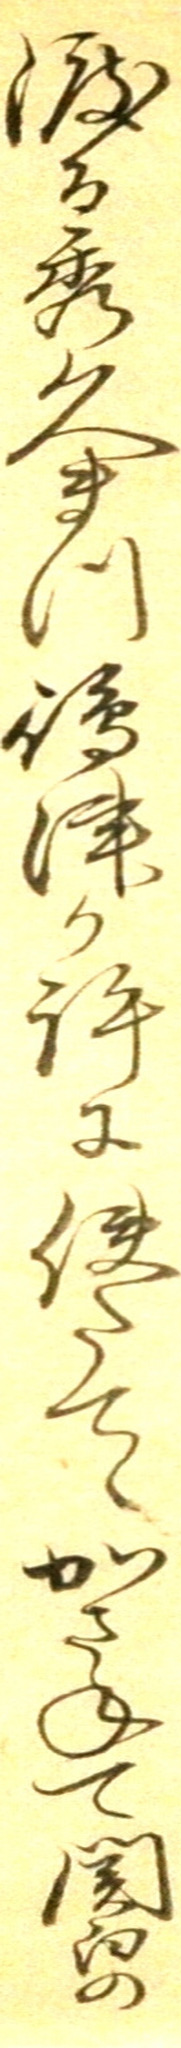渡る秀久まつ島津か許に使たてゝかさねて関白の
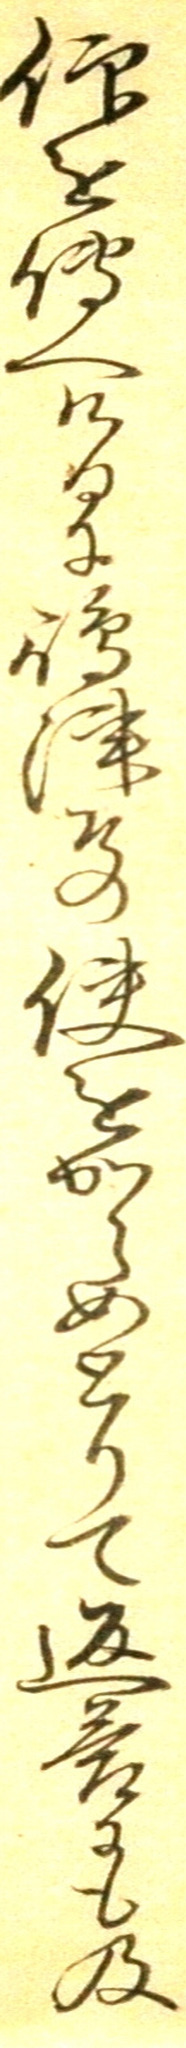仰を伝へけるに島津その使をからめとりて返答にも及
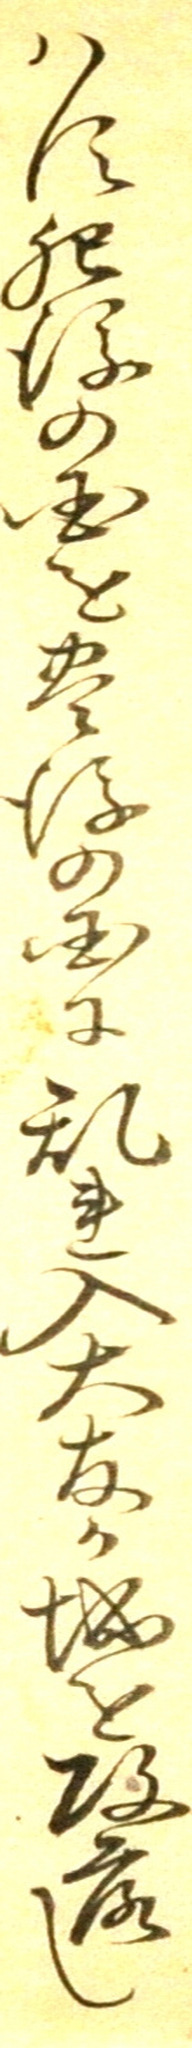はす肥後の国を豊後の国に乱れ入大友か城を攻落し
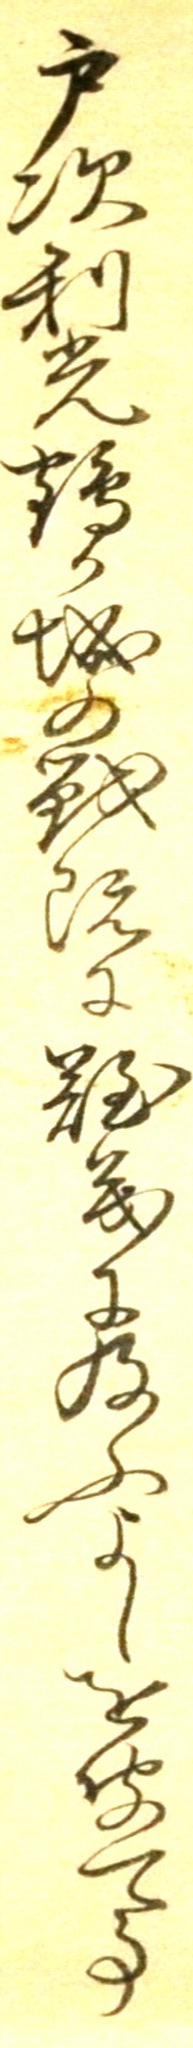戸次利光鶴か城の戦既に難義に及ふよしを聞て事
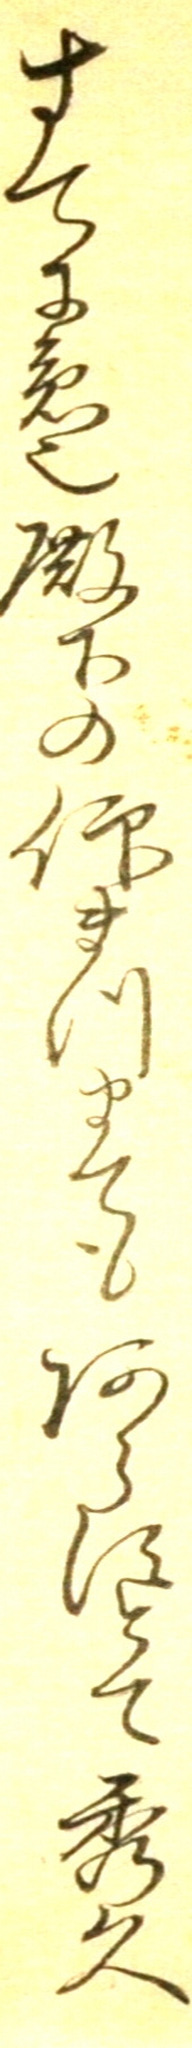すてに急也殿下の仰まつまてもあらすとて秀久
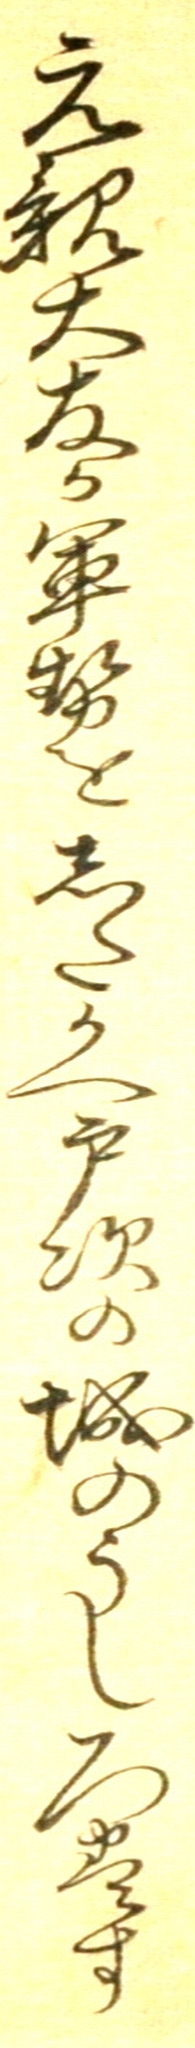元親大友か軍勢をしたかへ戸次の城のうしろ巻す
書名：藩翰譜（九・上）
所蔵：伊那市立高遠町図書館・合同会社AMANE
